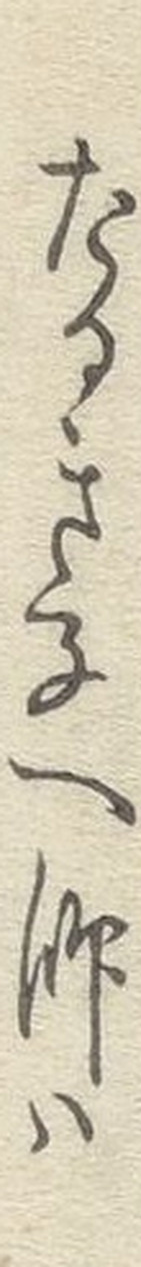たるき子へ師は
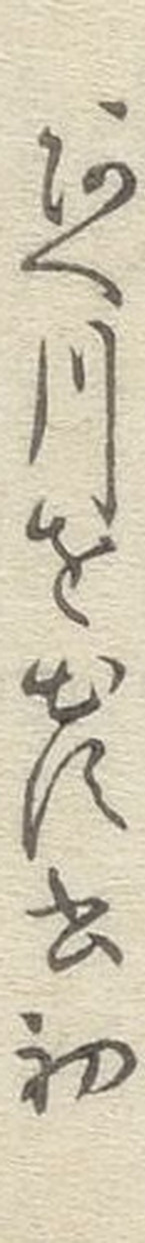あへ川を出す書初
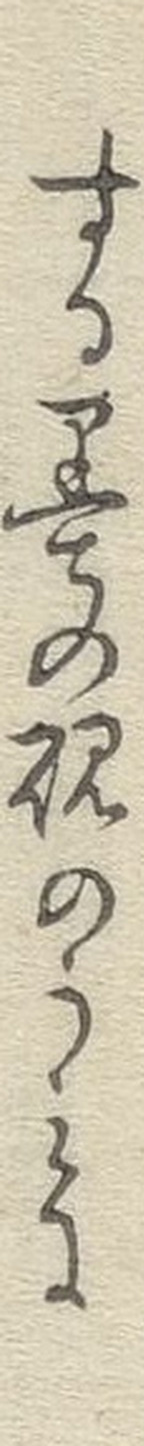する墨の硯のうみに
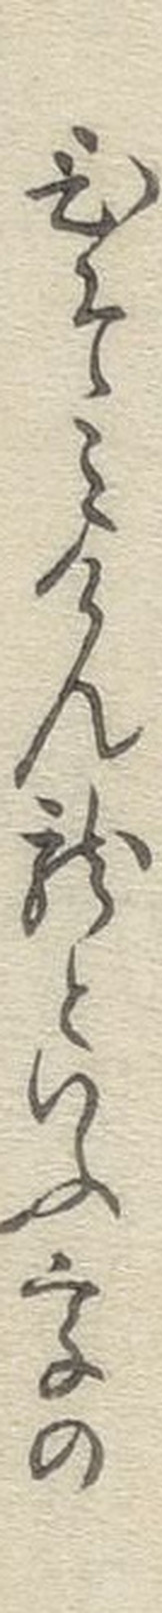ひそみけん龍といふ字の
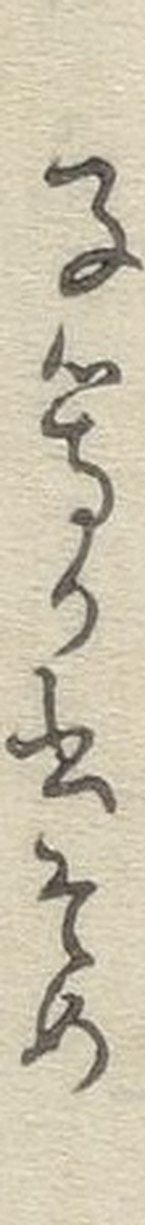子等か書そめ

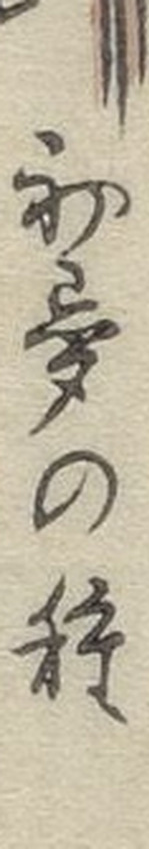初夢の種
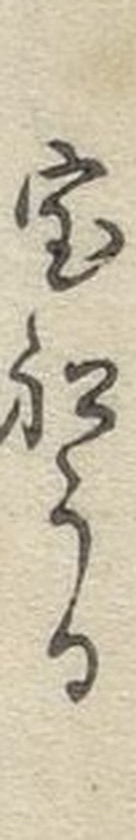宝船うる
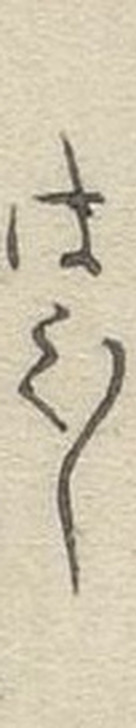はみ〳〵
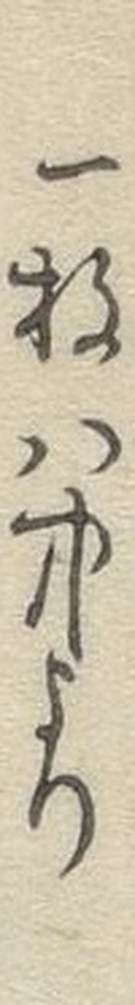一枚は中より
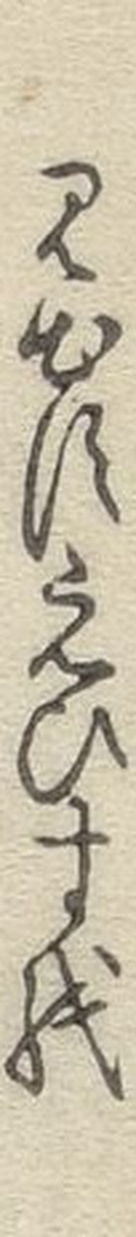見出すえひす紙
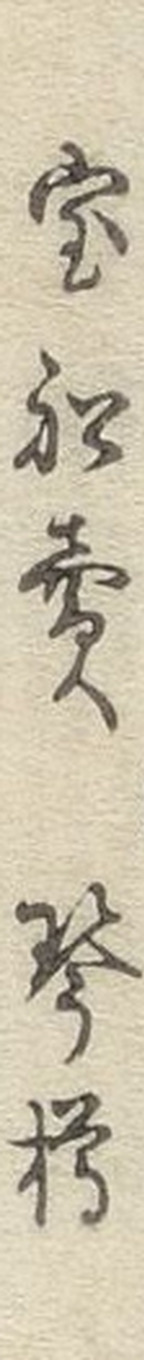宝船売琴樽
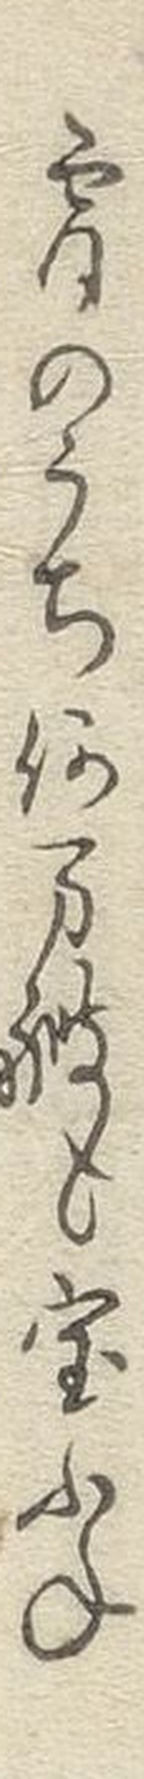宵のうち何万艘も宝ふね
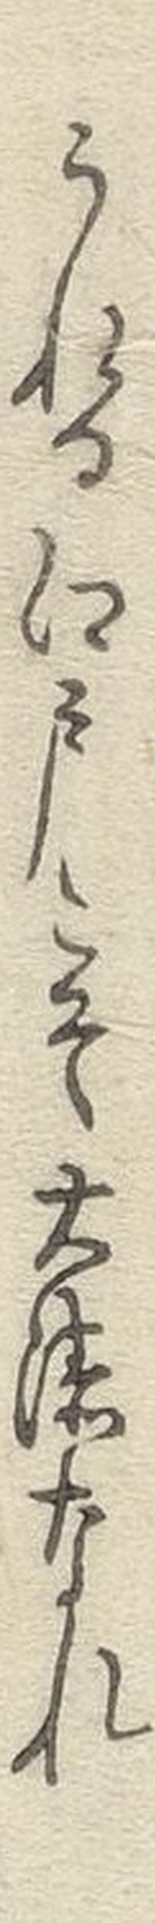うれる江戸こそ大湊なれ
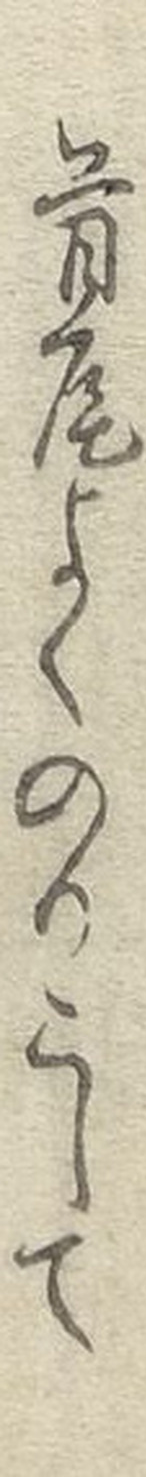首尾よくのりこして
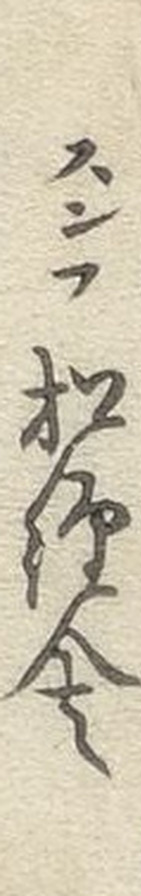スンフ松経舎
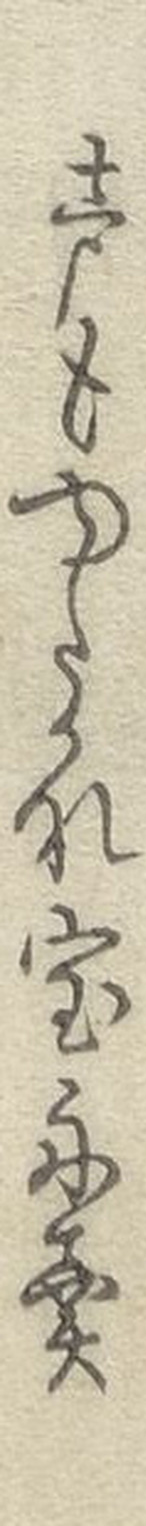声もゆたかな宝舟売
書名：Picture Album of People with Kyōka (Light Verse) (Kyōka shiki jinbutsu 狂歌四季人物)
